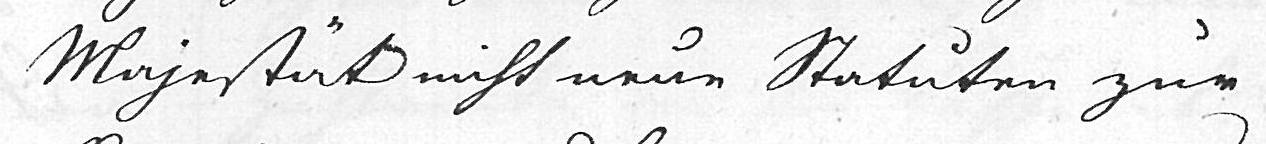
Majestät nicht neue Statuten zur
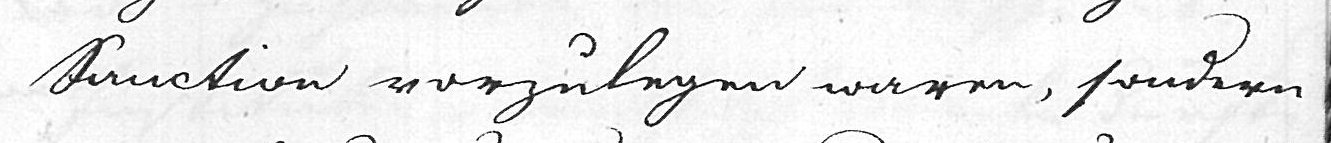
Sanction vorzulegen waren, sondern
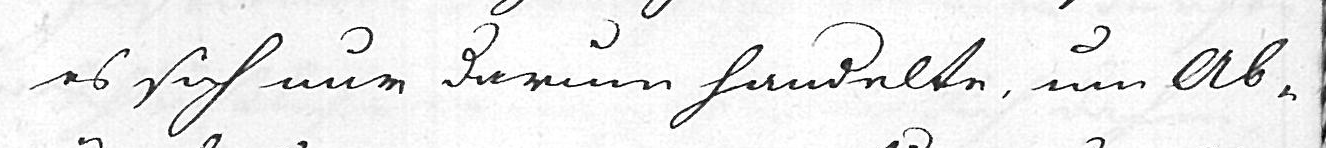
es sich nur darum handelte, um Ab-
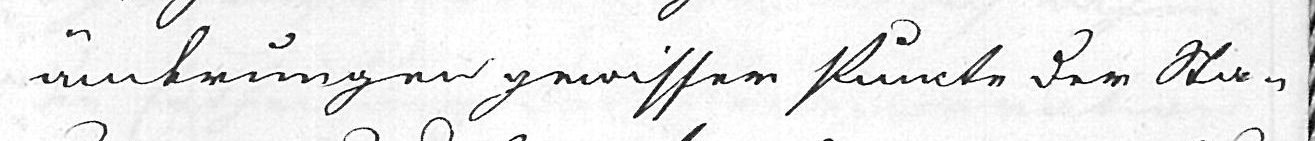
änderungen gewisser Puncte der Sta-
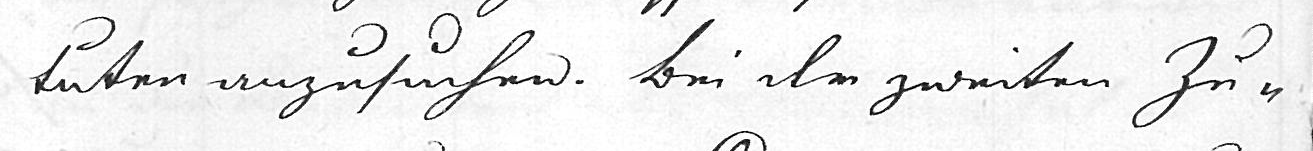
tuten anzusuchen. Bei der zweiten Zu-
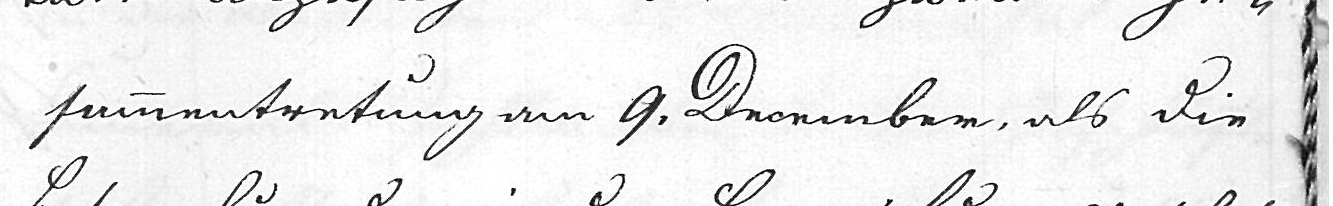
sammentretung am 9. December, als die
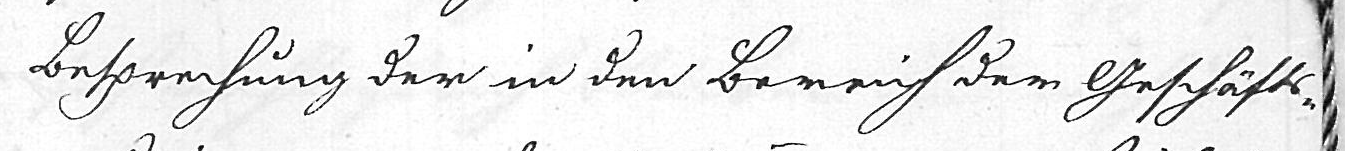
Besprechung der in den Bereich der Geschäfts-
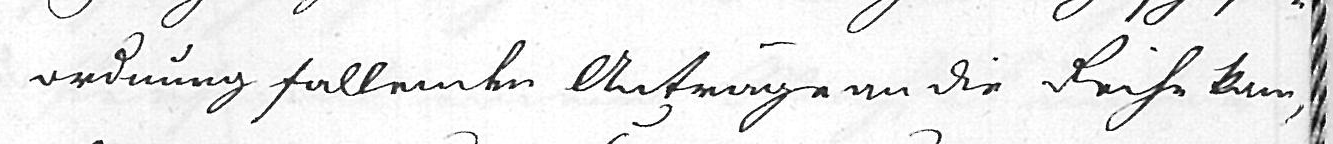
ordnung fallenden Anträge an die Reihe kam,
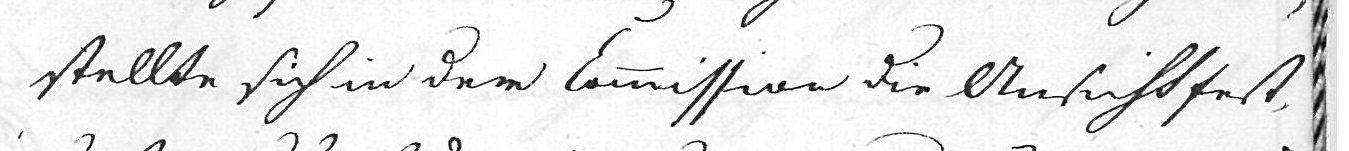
stellte sich in der Commission die Ansicht fest,
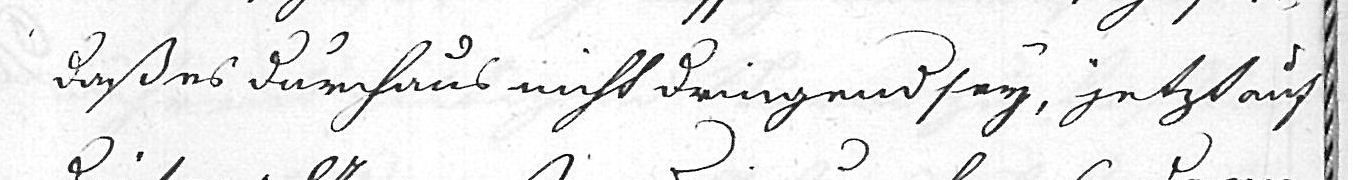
daß es durchaus nicht dringend sey, jetzt auf
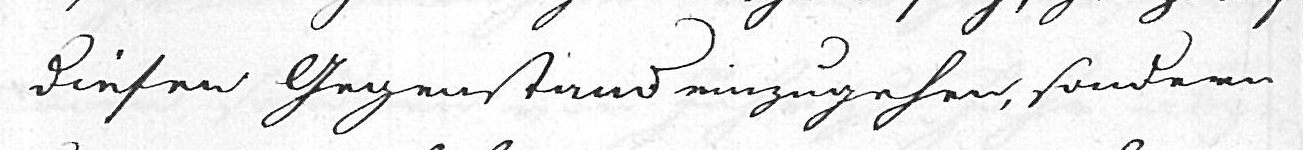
diesen Gegenstand einzugehen, sondern
